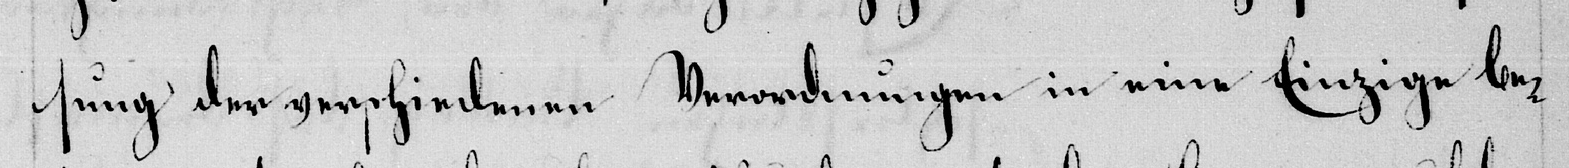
sung der verschiedenen Verordnungen in eine Einzige be¬
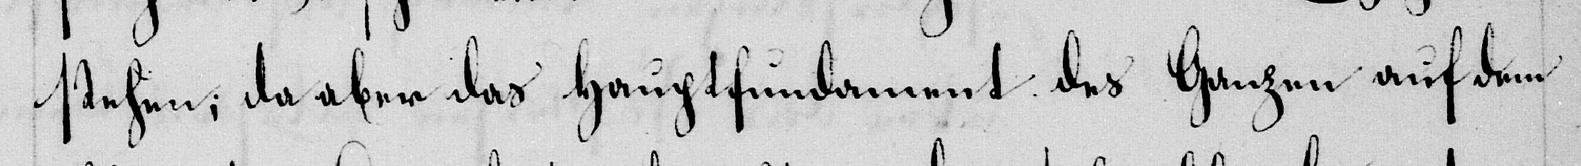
stehen, da aber das Hauptfundament des Ganzen auf dem
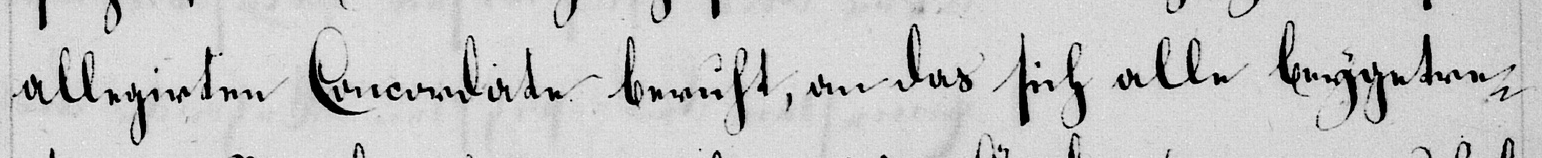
allegirten Concordate beruht, an das sich alle beygetre¬
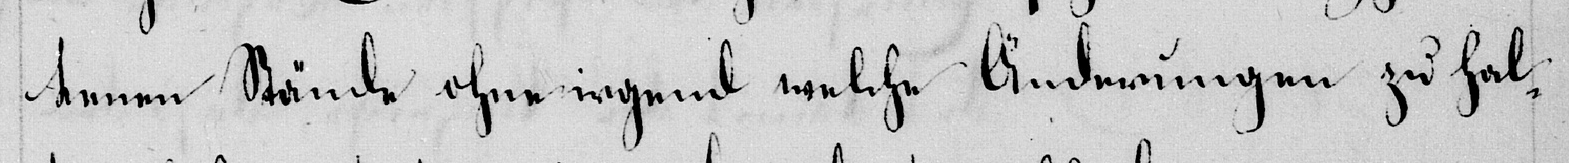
tenen Stände ohne irgend welche Änderungen zu hal¬
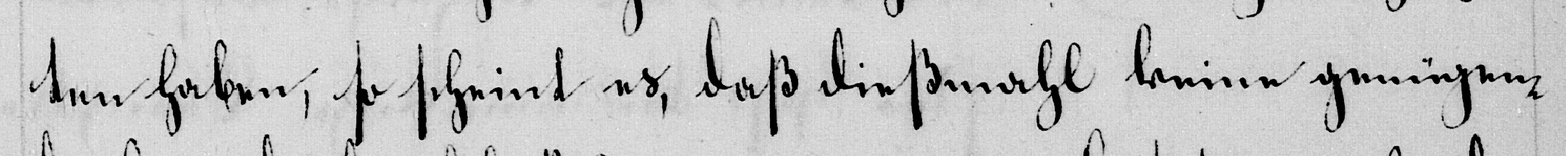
ten haben, so scheint es, daß dießmahl keine genügen¬
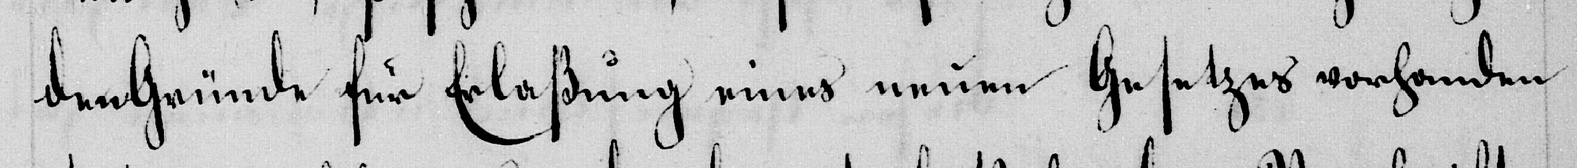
den Gründe für Erlaßung eines neuen Gesetzes vorhanden
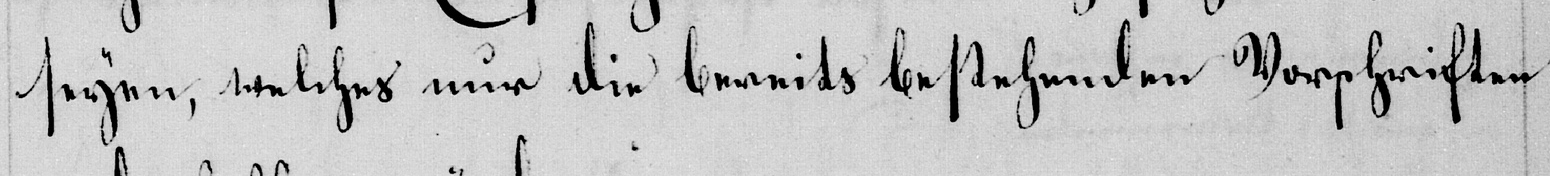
seyen, welches nur die bereits bestehenden Vorschriften
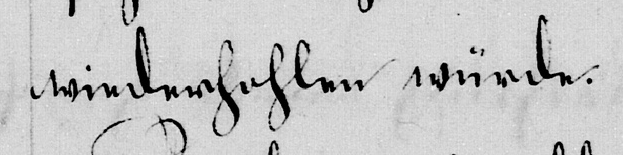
wiederhohlen würde.
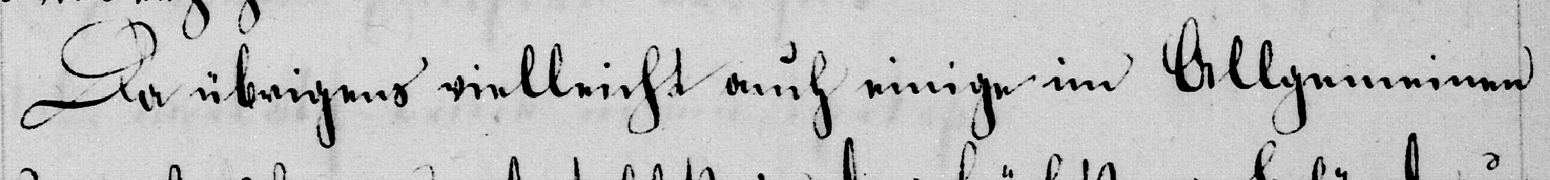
Da übrigens vielleicht auch einige im Allgemeinen
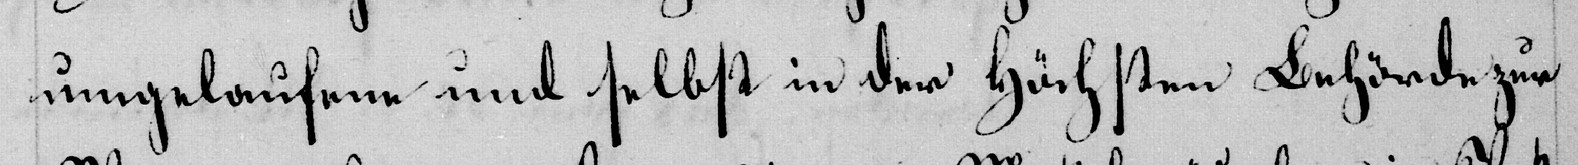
umgelaufene und selbst in der Höchsten Behörde zur
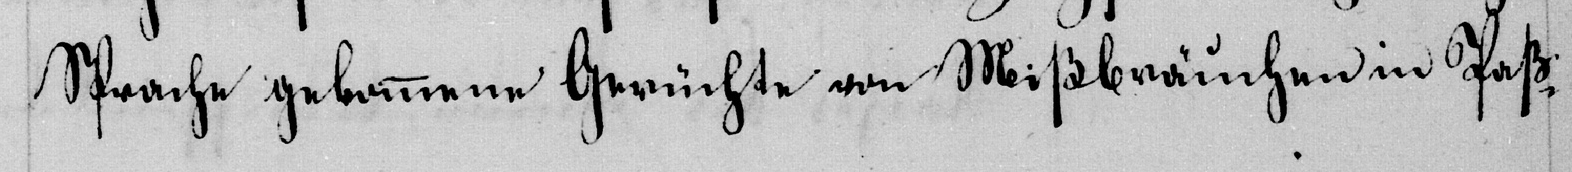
Sprache gekommene Gerüchte von Mißbräuchen in Paß-
